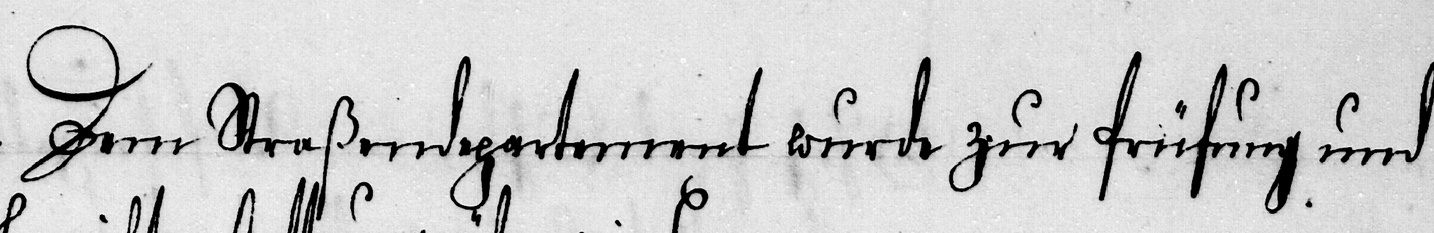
Dem Straßendepartement wurde zur Prüfung und
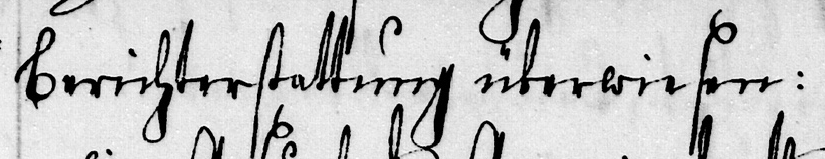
Berichterstattung überwiesen:
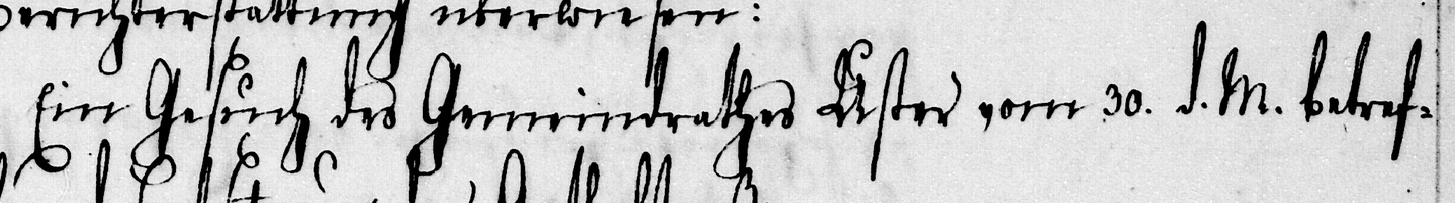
Ein Gesuch des Gemeindrathes Uster vom 30. d. M. betref¬
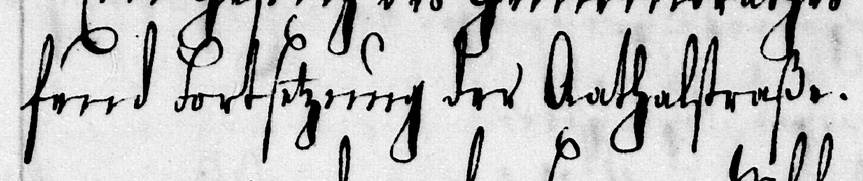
fend Fortsetzung der Aathalstraße.
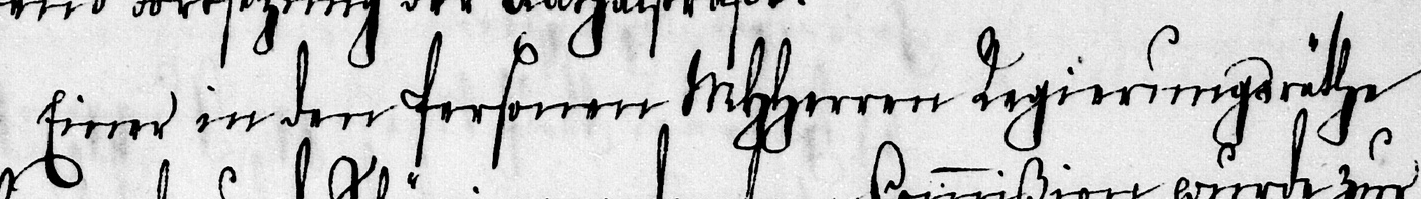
Einer in den Personen MHHerren Regierungsräthe
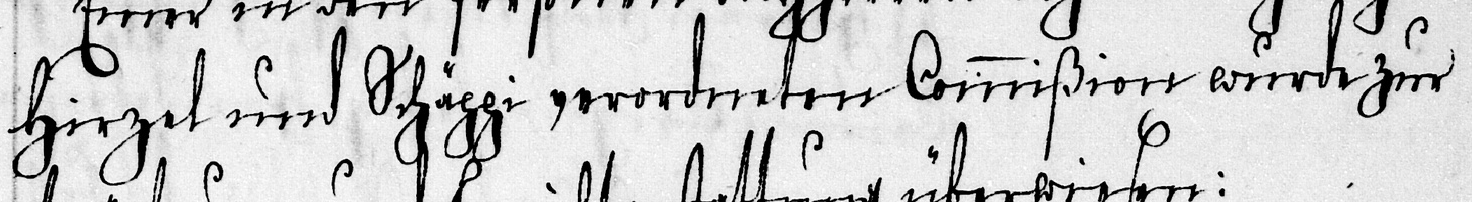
Hirzel und Schäppi verordneten Commißion wurde zur
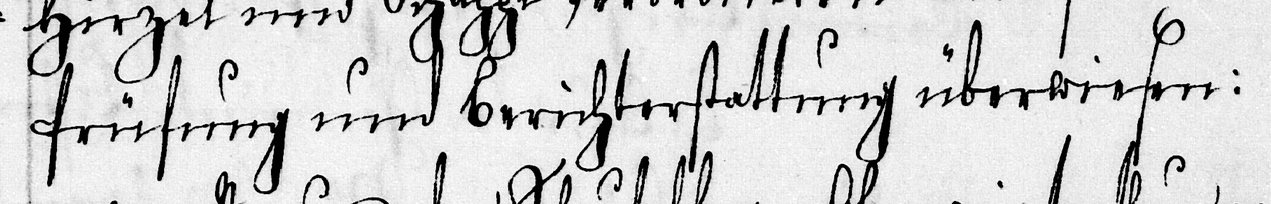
Prüfung und Berichterstattung überwiesen:
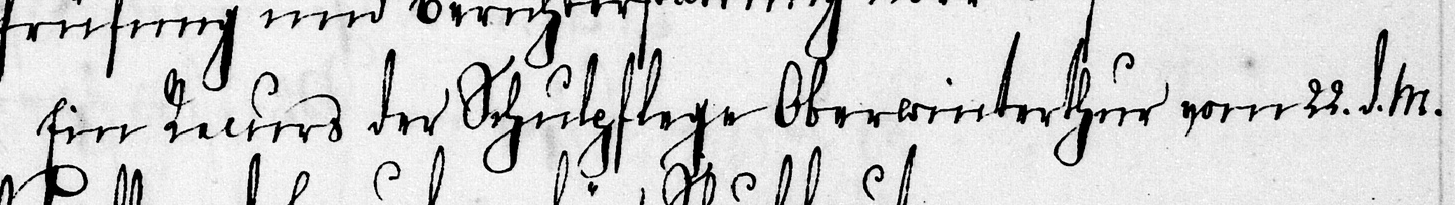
Ein Recurs der Schulpflege Oberwinterthur vom 22. d. M.
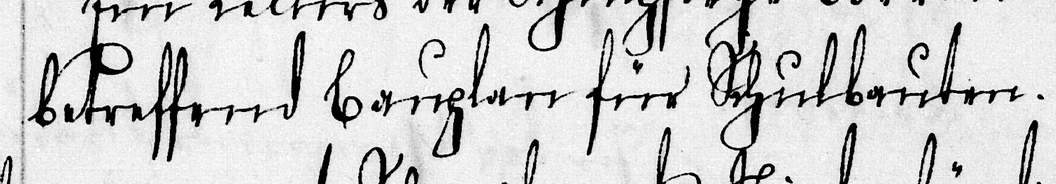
betreffend Bauplan für Schulbauten.
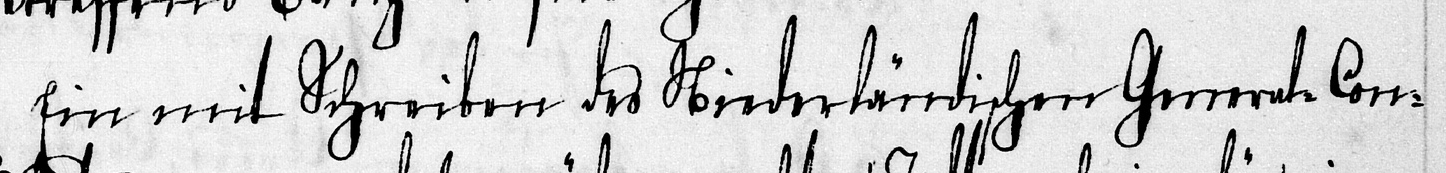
Ein mit Schreiben des Niederländischen General-Con¬
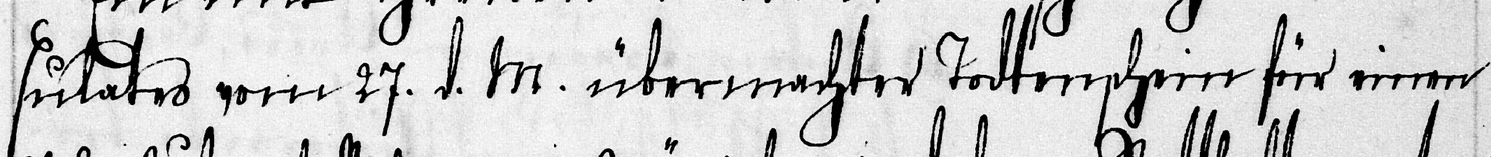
sulates vom 27. d. M. übermachter Todtenschein für einen
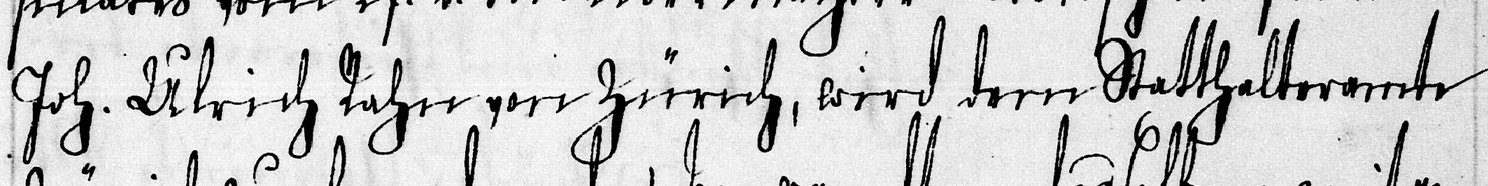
Joh. Ulrich Rahn von Zürich, wird dem Statthalteramte
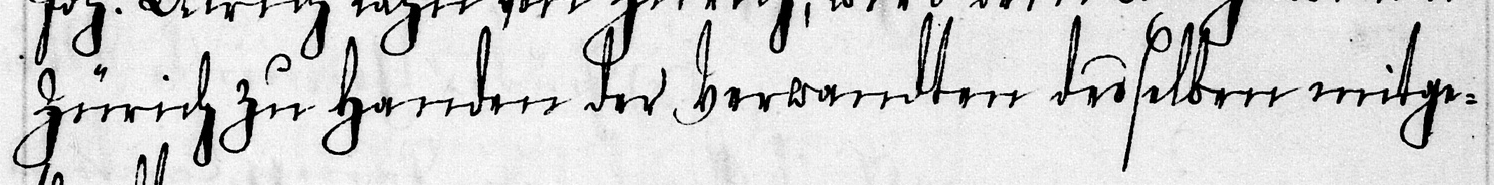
Zürich zu Handen der Verwandten desselben mitge¬
